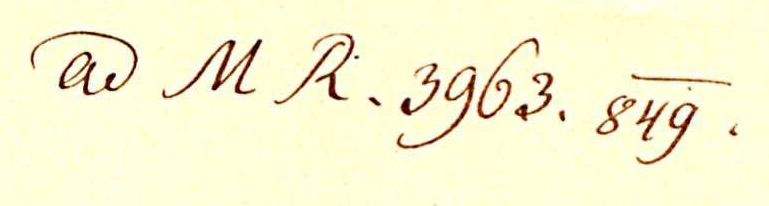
ad M R. 3963. 849.
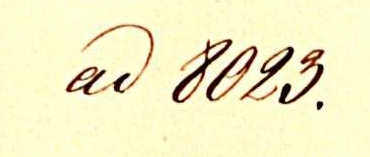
ad 8023.
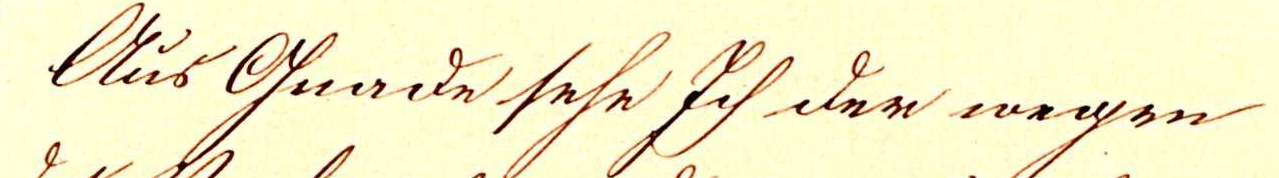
Aus Gnade sehe Jch der wege
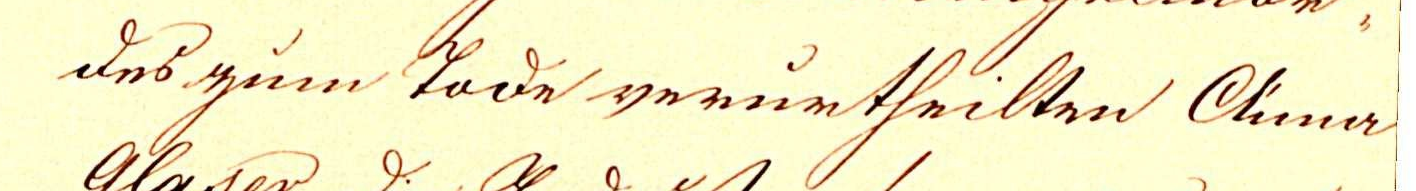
des zum Tode verurtheilten Anna
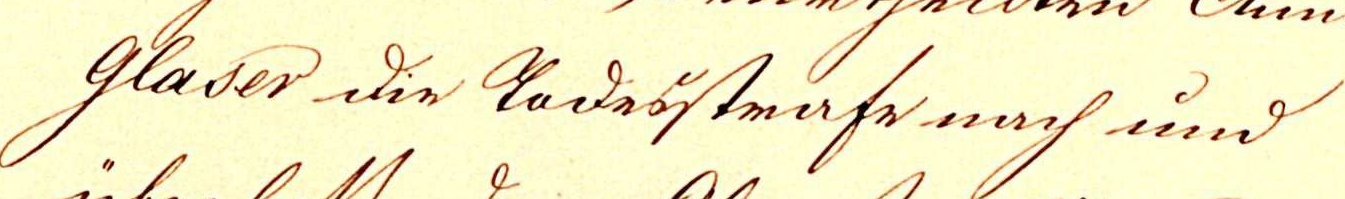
Glaser die Todesstrafe nach und
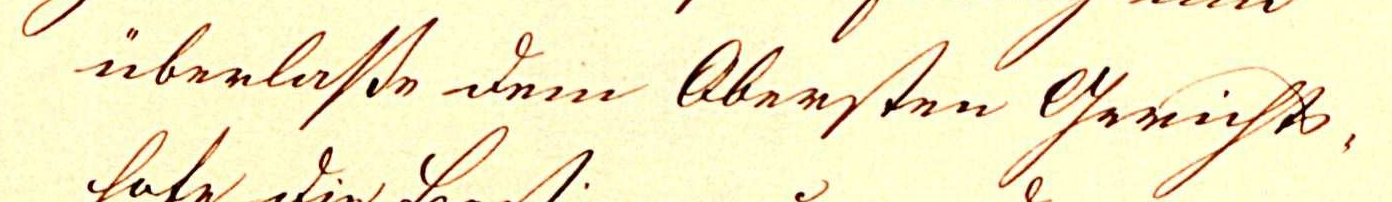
überlaße dem Obersten Gerichts¬
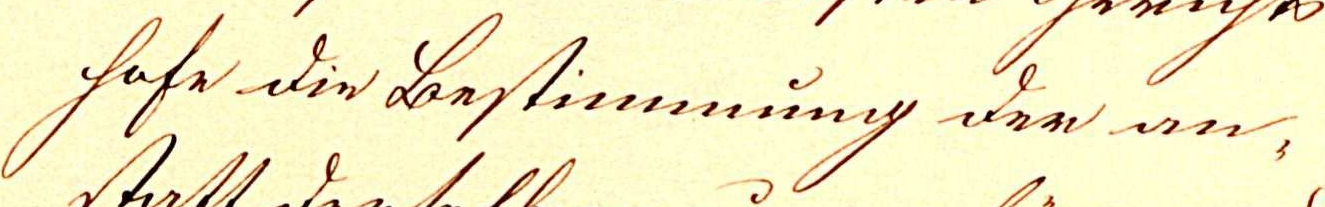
hofe die Bestimmung der an¬
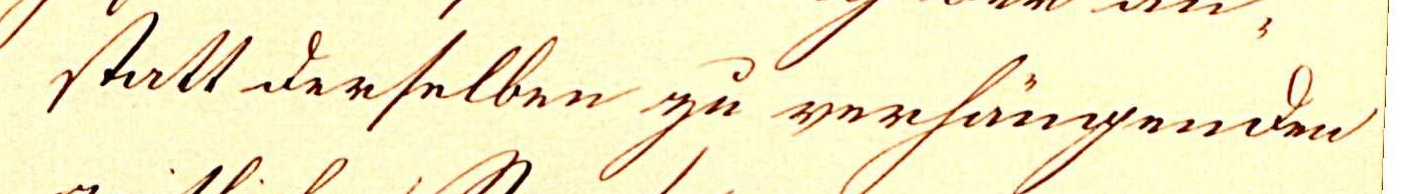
statt derselben zu verhängenden
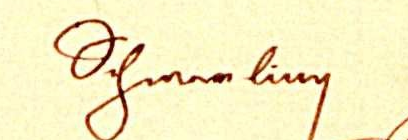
zeitlichen Strafe.
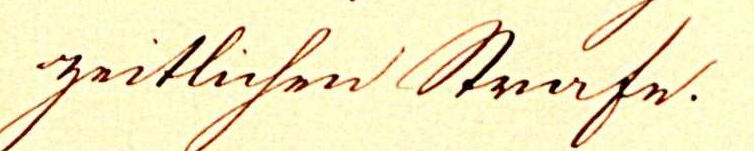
Schmerling
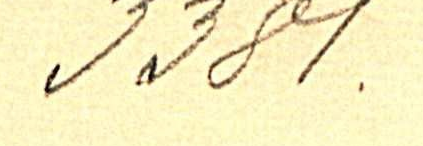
3381.
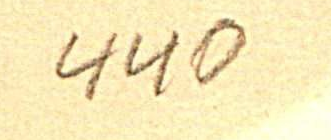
440
